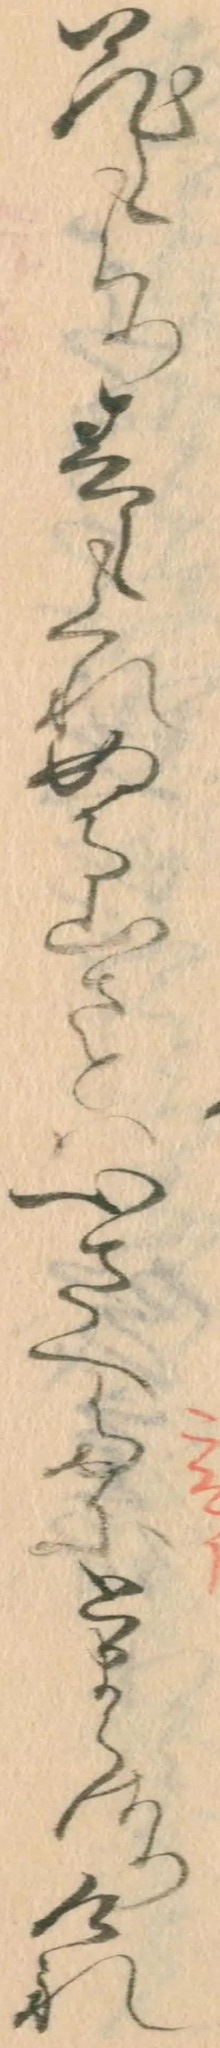花もちり春もくれぬる山さとは心さへたにとまらさりけれ
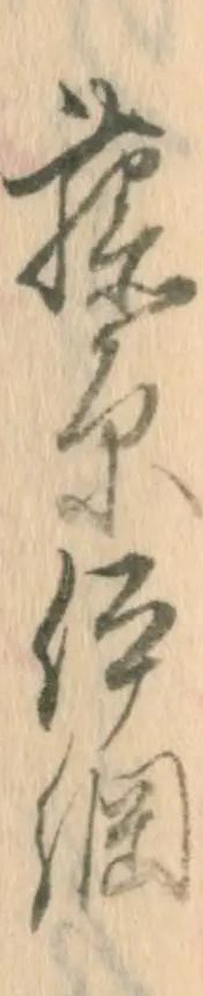藤原伊綱
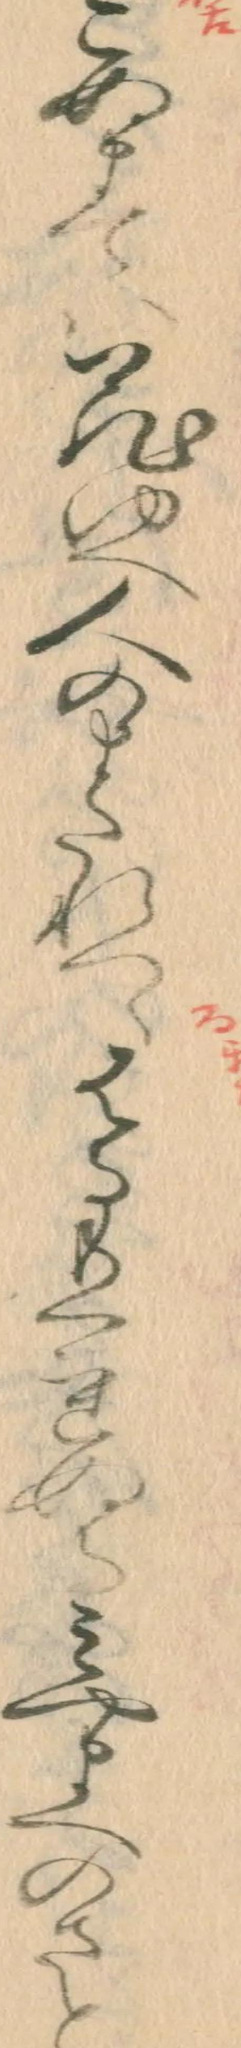こぬまては花ゆへ人のまたれつゝはるもくれぬるみやまへのさと
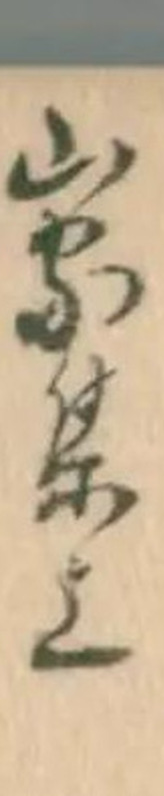山家集上
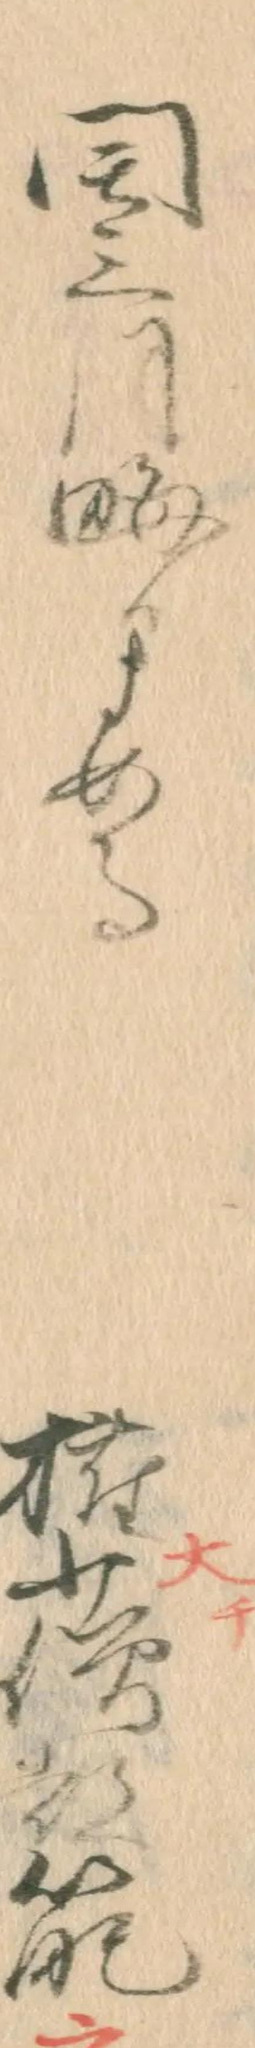閏三月晦日よめる権少僧都範玄
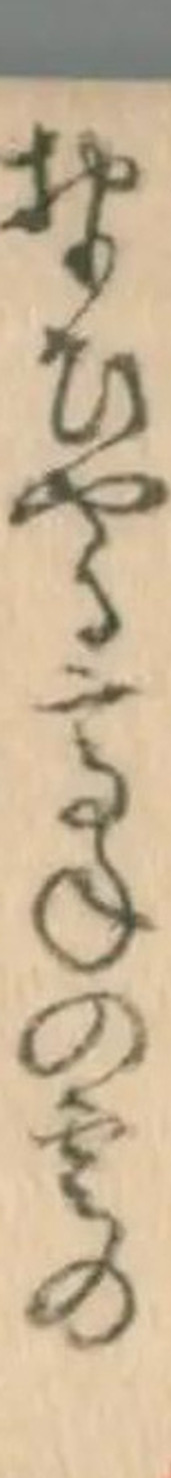おもひやる高ねの空の
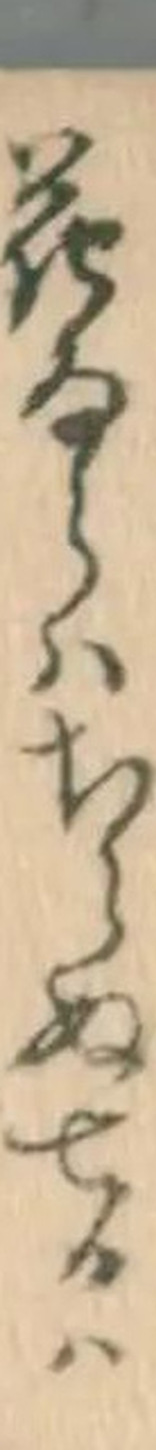花ならはちらぬ七日は
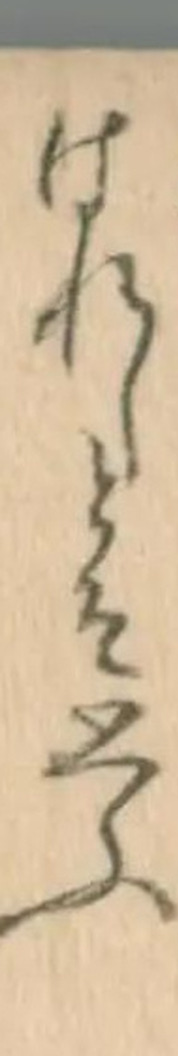はれしとそ思ふ
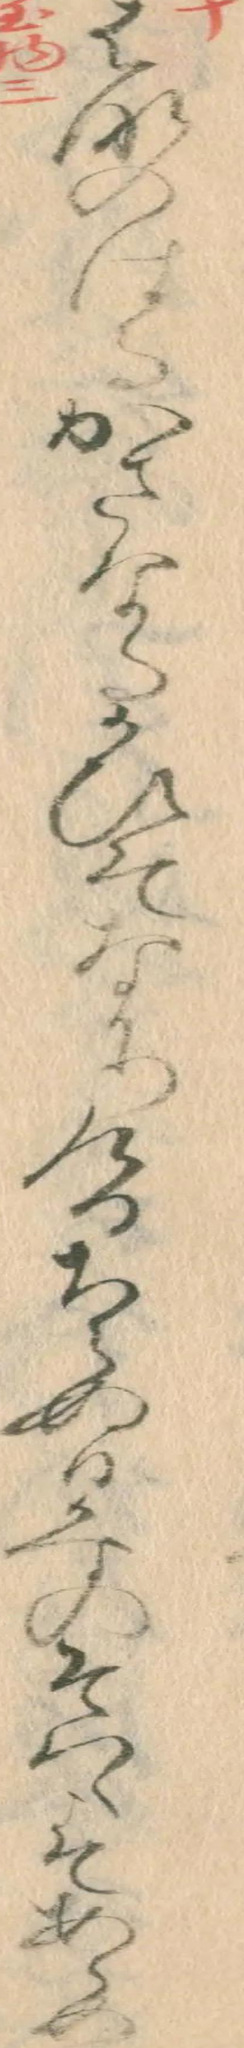はなのはるかさなるかひそなかりけるちらぬ日かすのそはゝこそあらめ
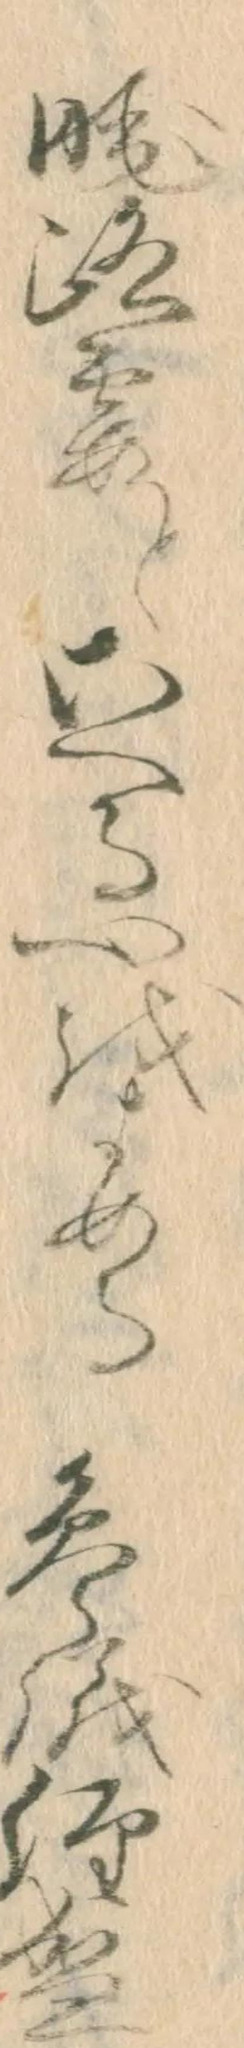暁路霞といへる心をよめる参議経盛
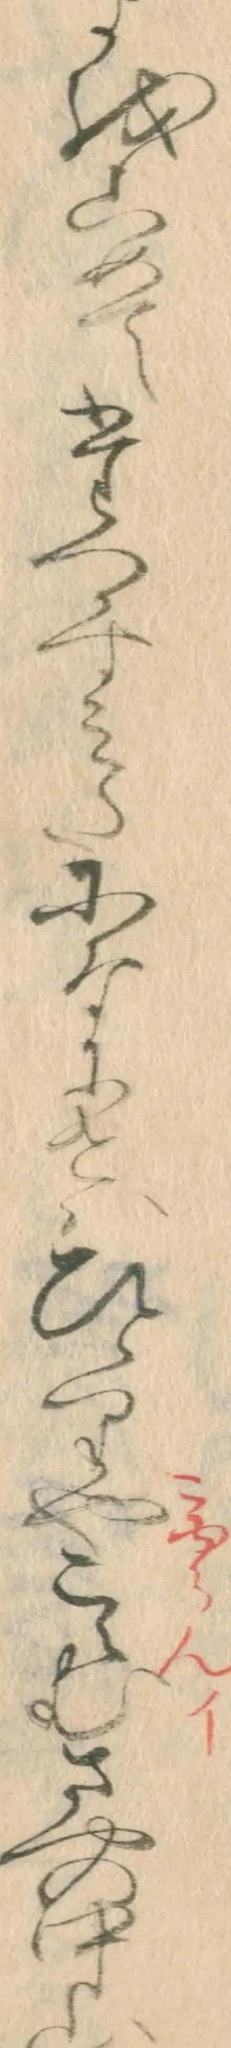よをこめてたつかすみたになかりせはひとりやこえむさやの中山
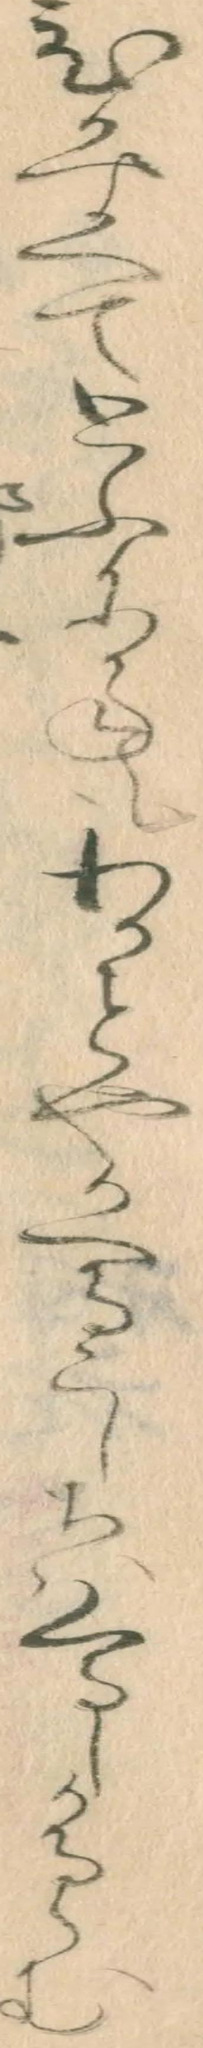ひかすへてとふかりかねもわかことやかへるこしちはくるしかるらむ

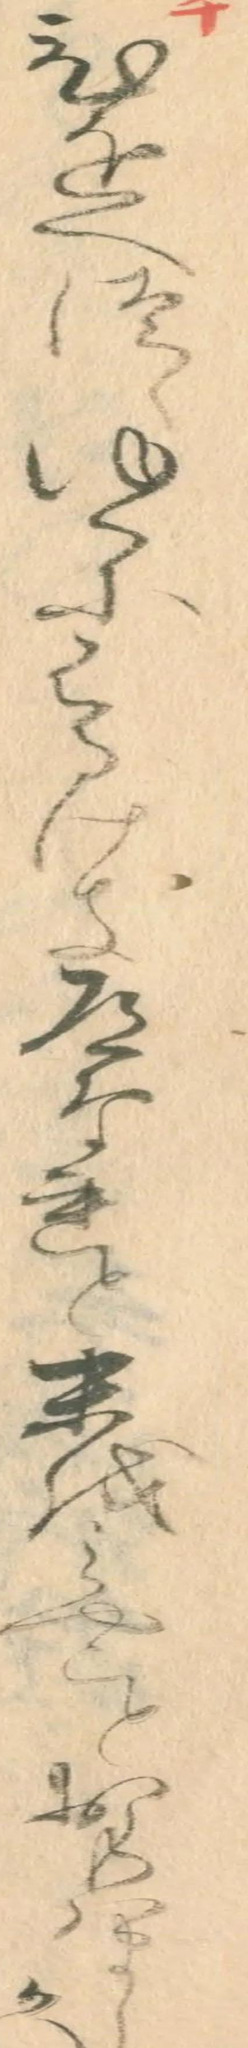ひをへつゝゆくにはるけき道なれと末をみやことおもはましかは
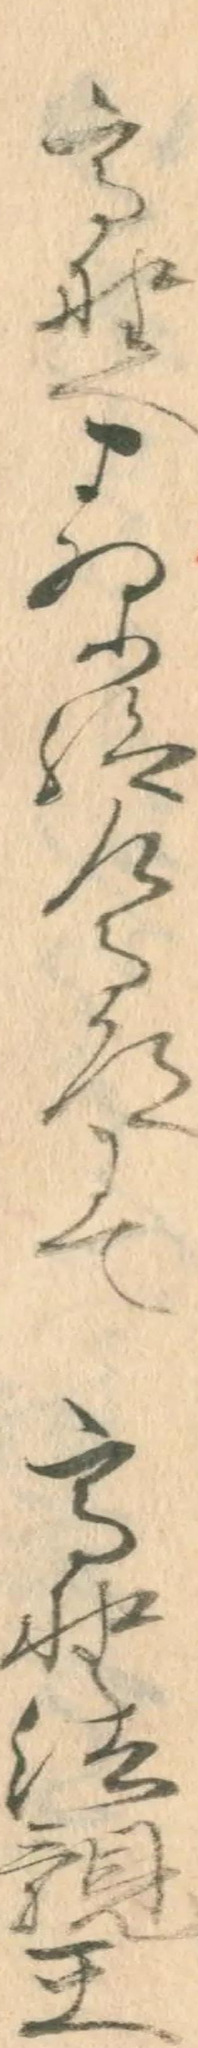高野へまゐり給ける道にて高野法親王
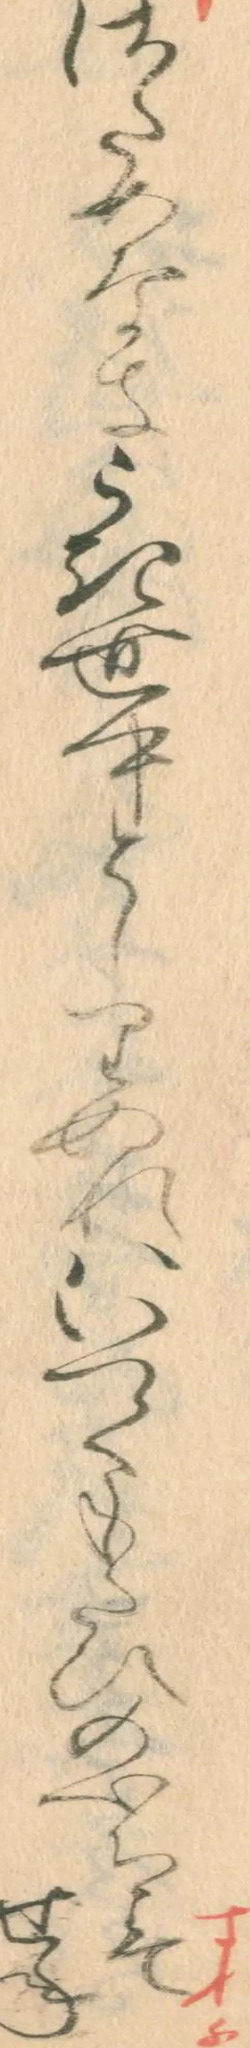さためなきうき世中としりぬれはいつくもたひの心ちこそせね
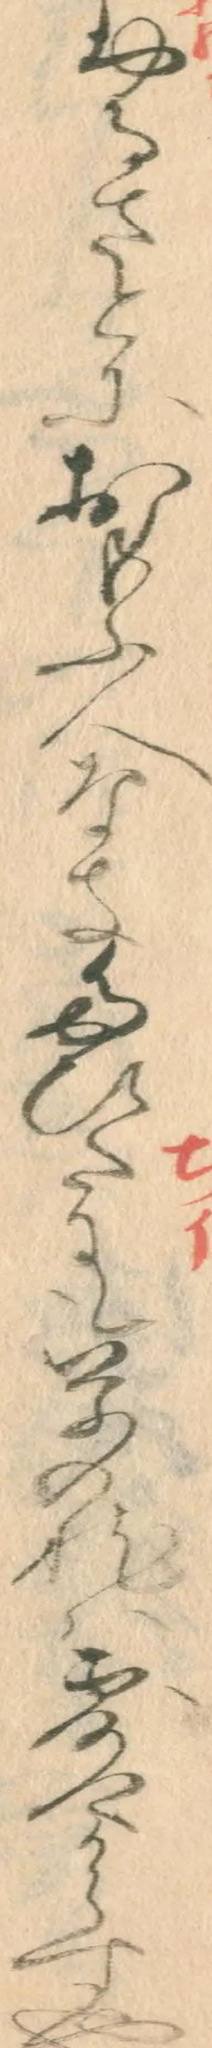ふるさとにおもふ人なきたひたにも草の枕は露けからすや
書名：月詣和歌集
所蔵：国立国会図書館 National Diet Library, JAPAN
